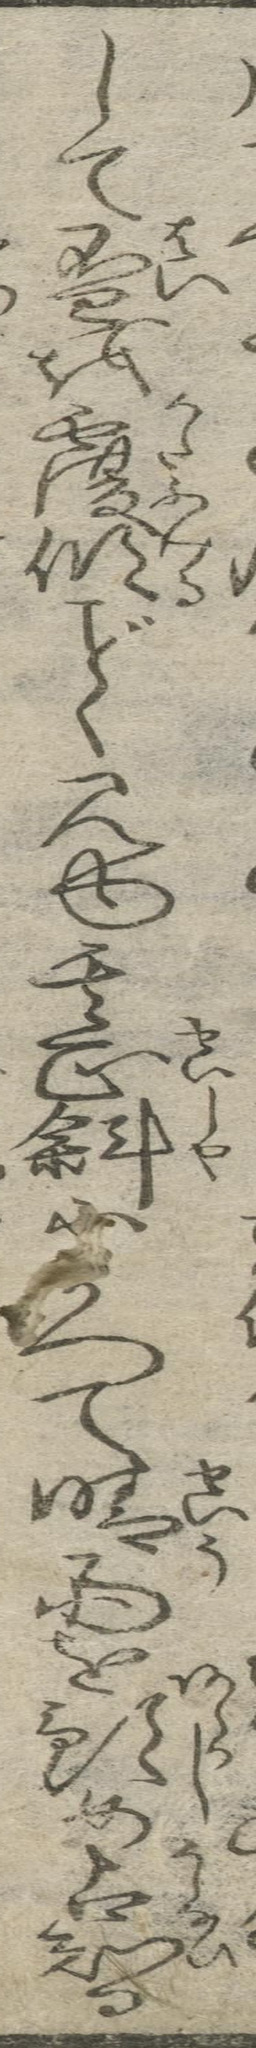して盃を覆傾ごとく見ゆ其正斜にかつて晴雨を預め占知る
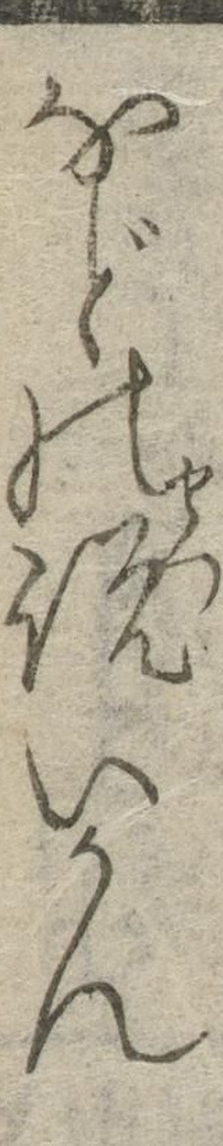などの説いかん

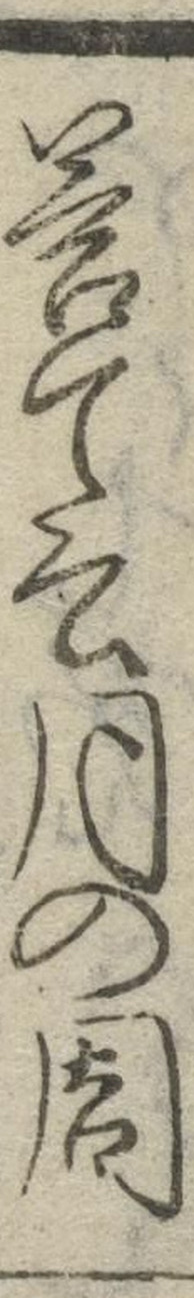答て云月の周
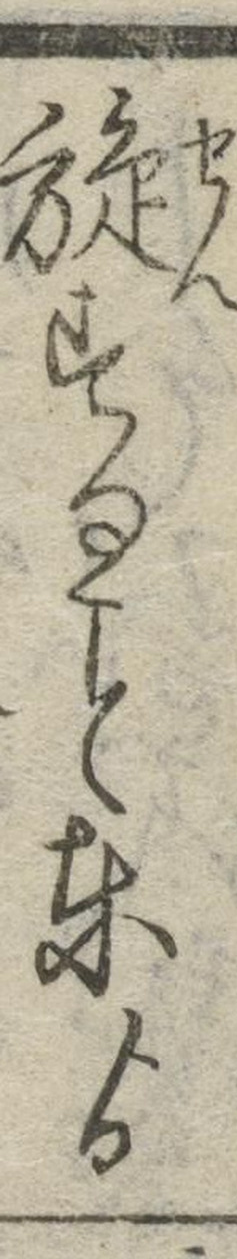旋すること東ゟ
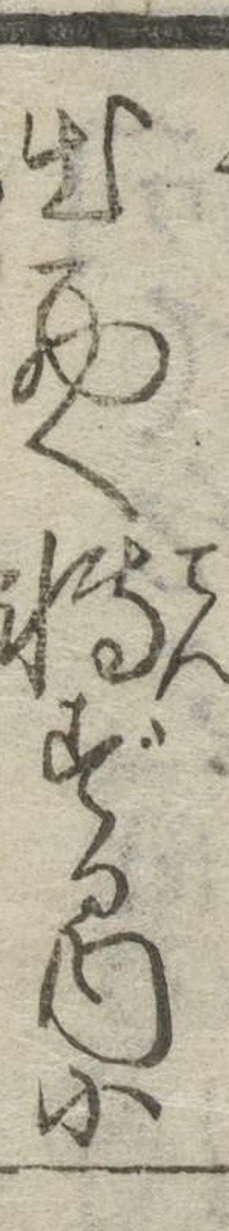出西へ転ずる内に
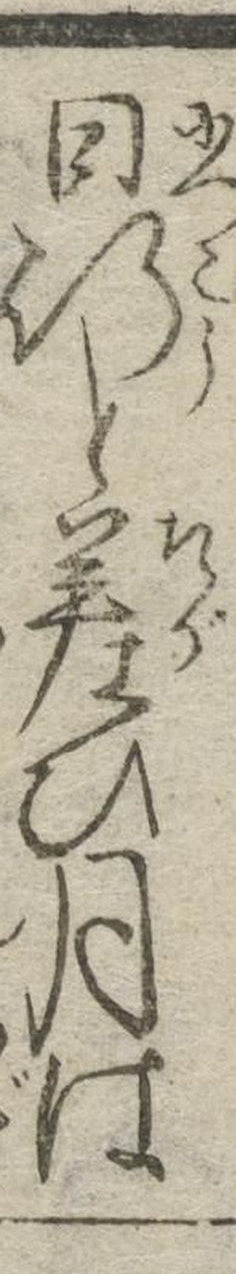日行と差ひ月は
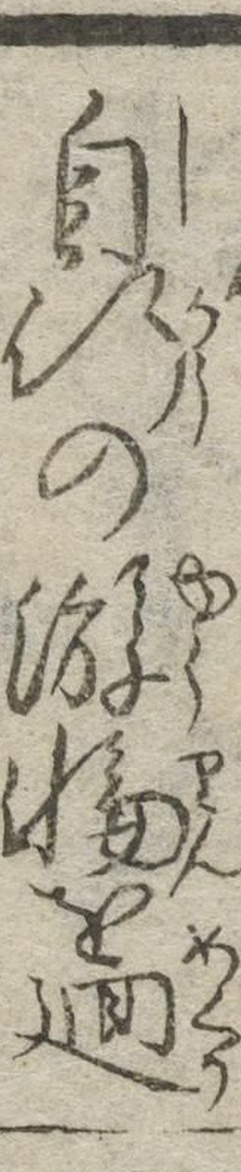自行の游輪を廻
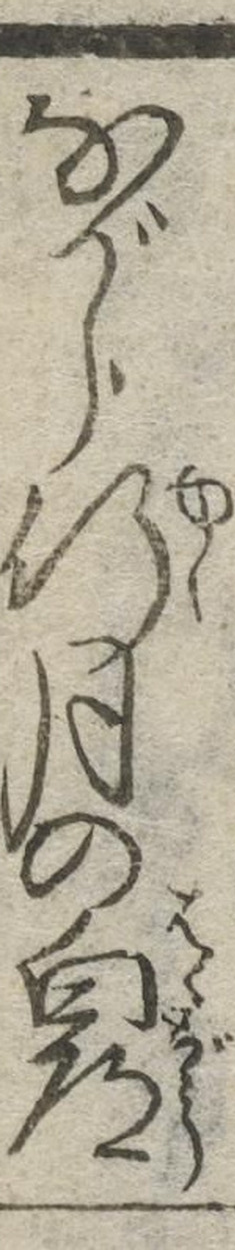ながら行月の白道
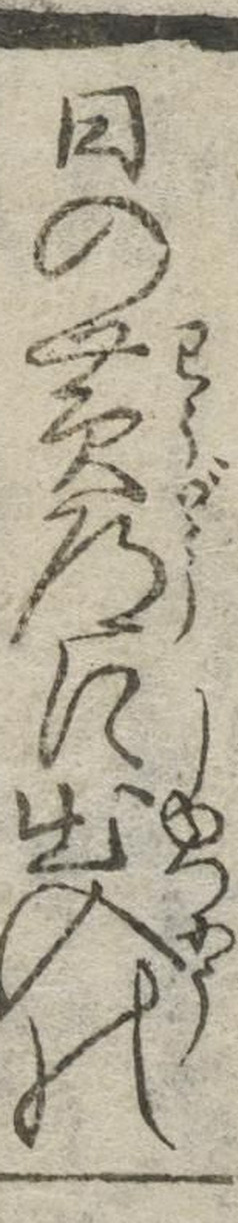日の黄道に出入の
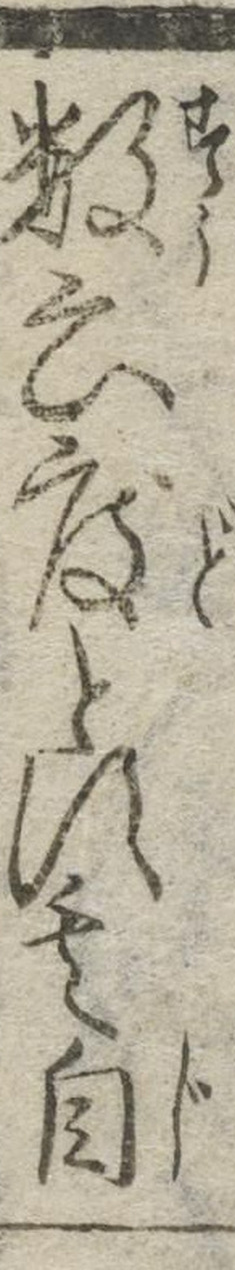数六度とす其自
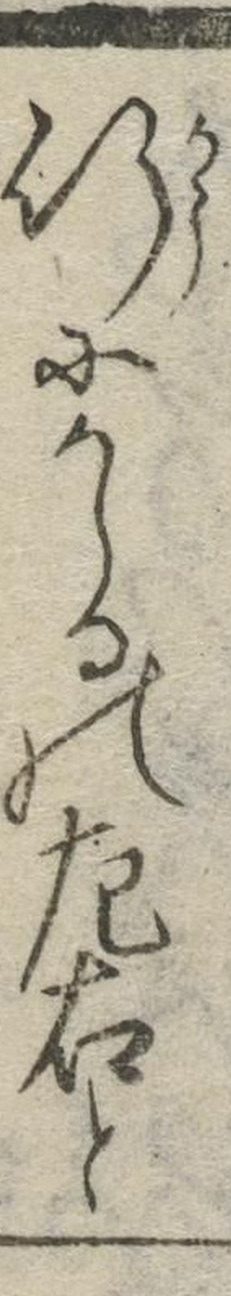行にかゝるの左右と
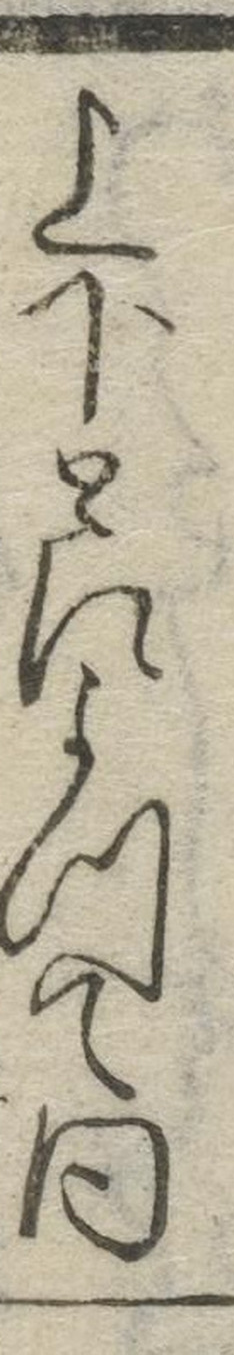上下とによつて同
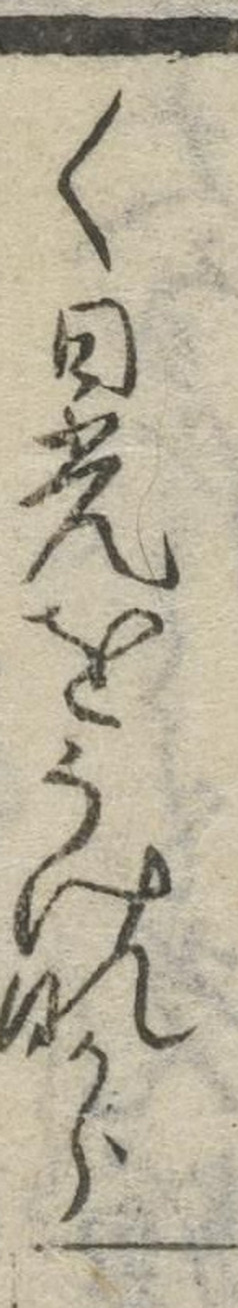く日光をうけなから
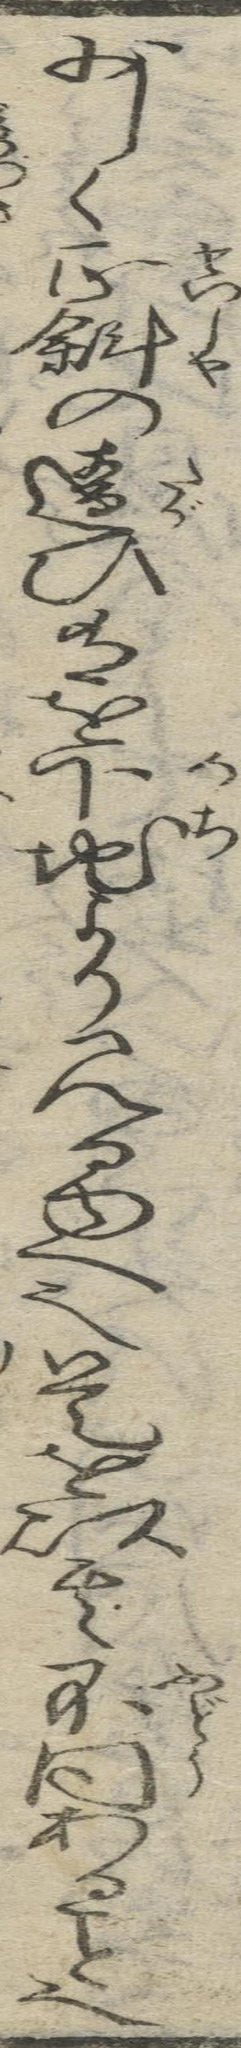少しく正斜の違ひ有を下地より見るゆへ也是を以其不同あること也
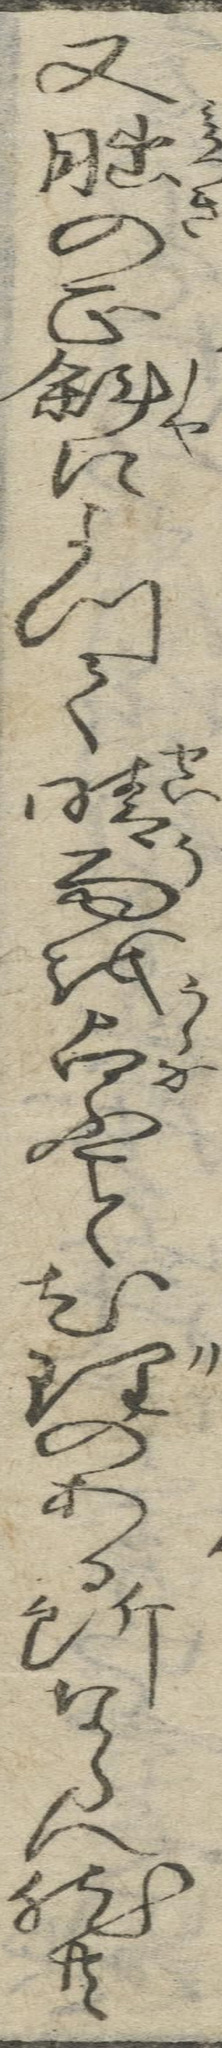又朏の正斜によつて晴雨を占ふこと尤理のある所ならん然共
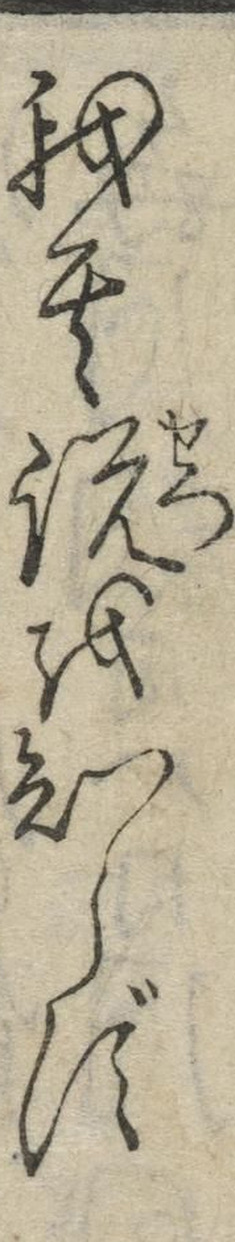我其説を知らず
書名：訓蒙天地辨　天
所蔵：東京大学地震研究所図書室 Earthquake Research Institute Library, The University of Tokyo, JAPAN
